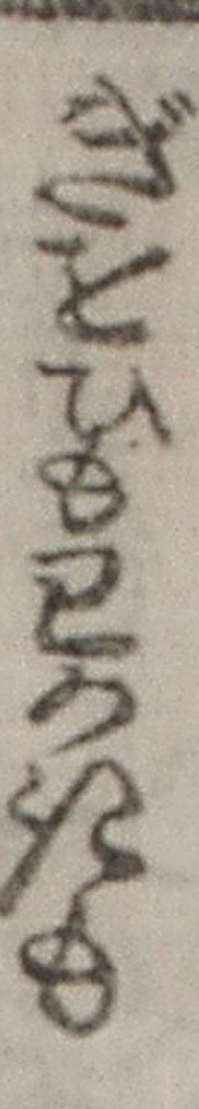ぎをひもわかきも
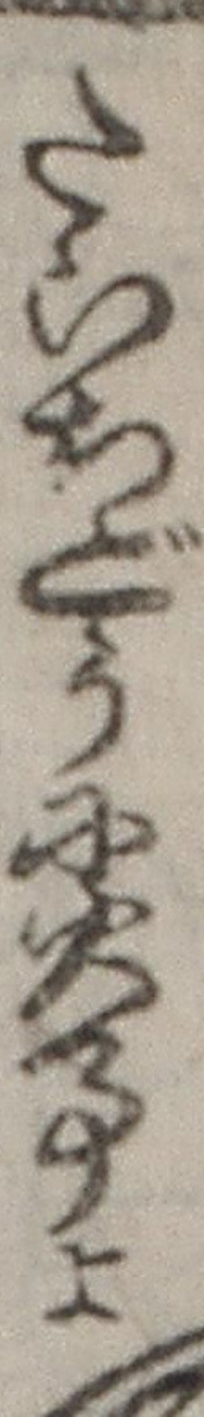たゝいちどうに火事よ
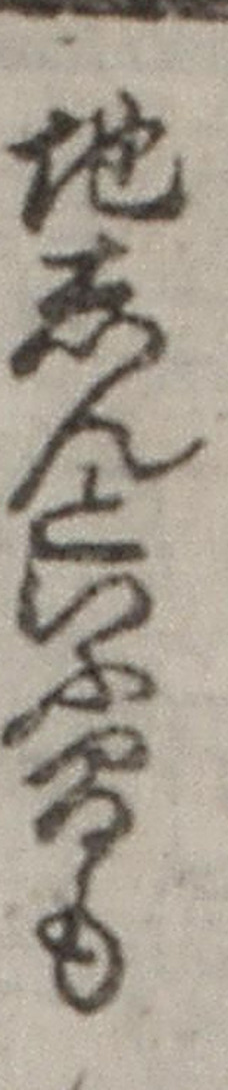地しんといふ間も
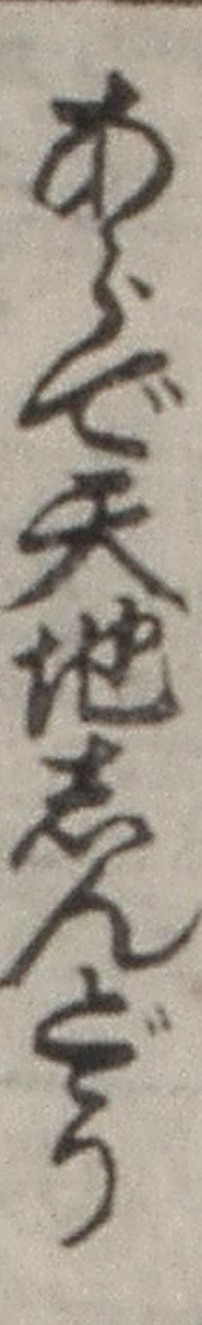あらで天地しんどう
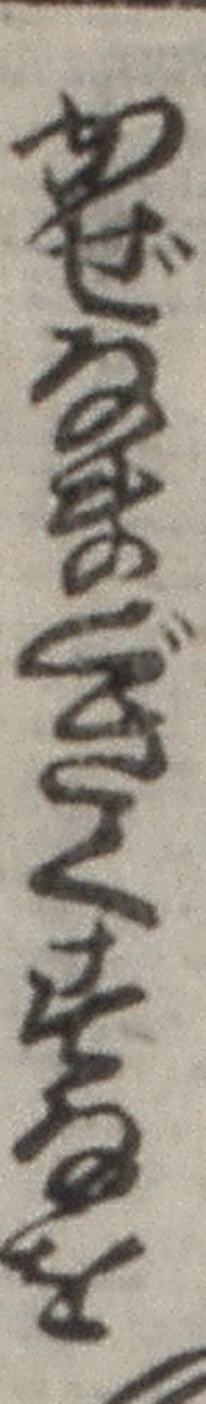かぜなまぐさくすなを
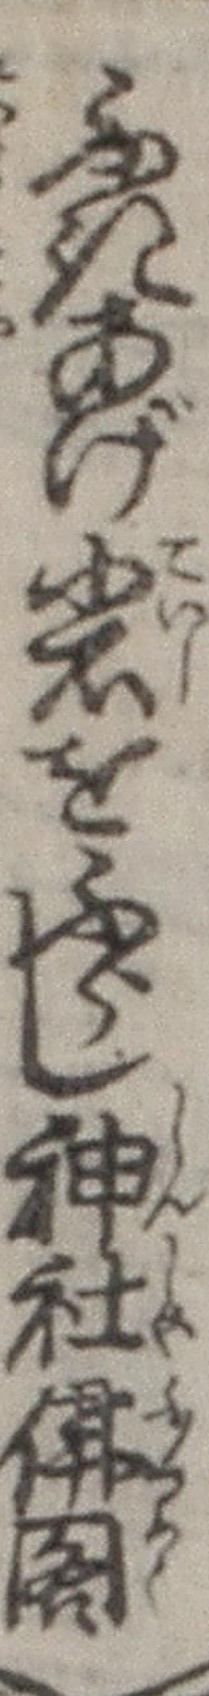ふきあげ小石をふらし神社仏閣
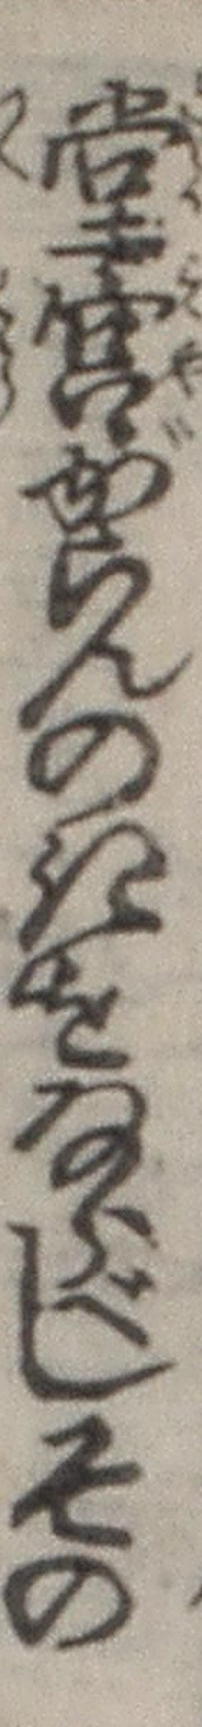堂宮がらんのきをならべしその
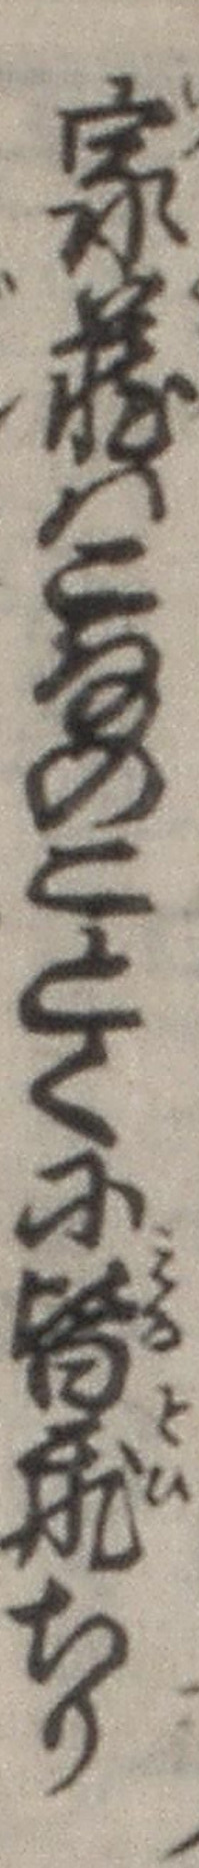家蔵はこなのことくに皆飛ちり
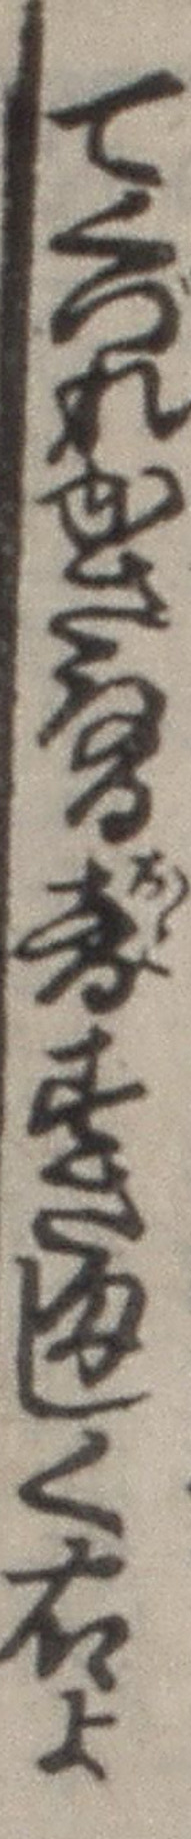てくづれかさなる音すさましく右よ
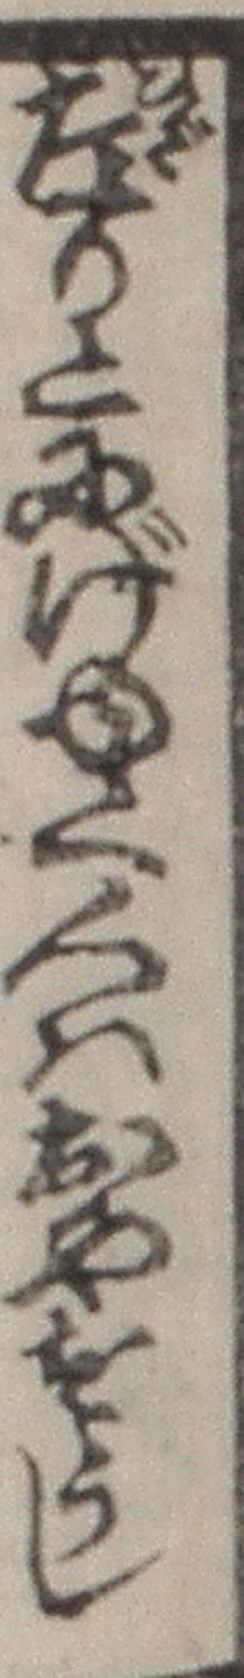左りとにげゆく人はおやをうし
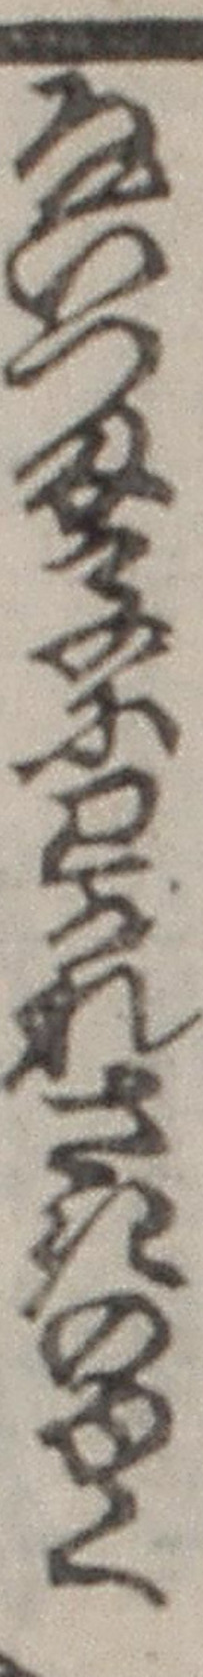ないつま子にわかれさきのゆく
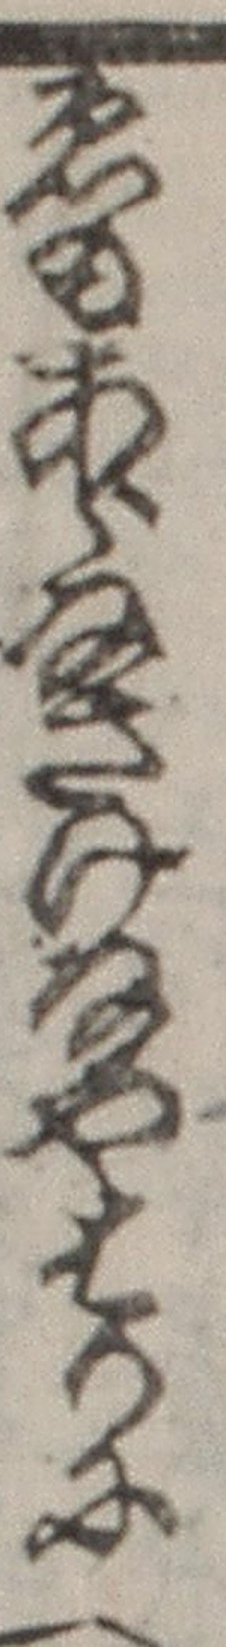ゑもあらなさけなやはりに
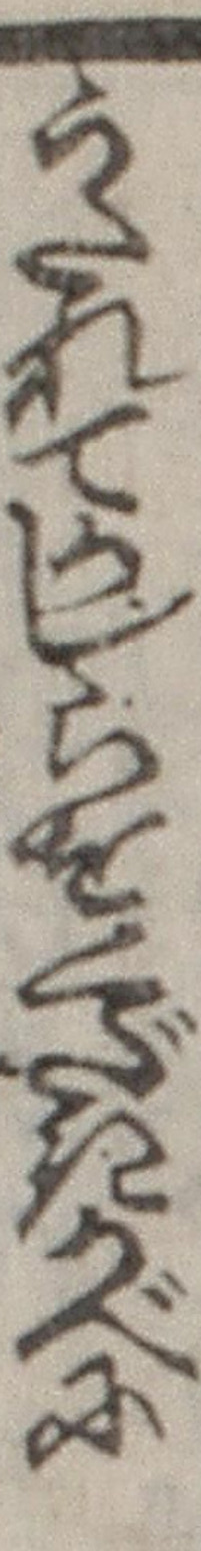うたれてかしらをくだきかべに
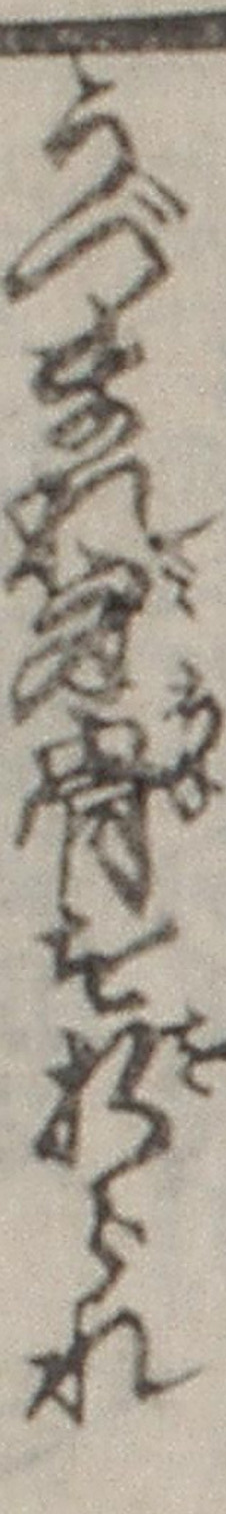うづまれ身骨を折られ
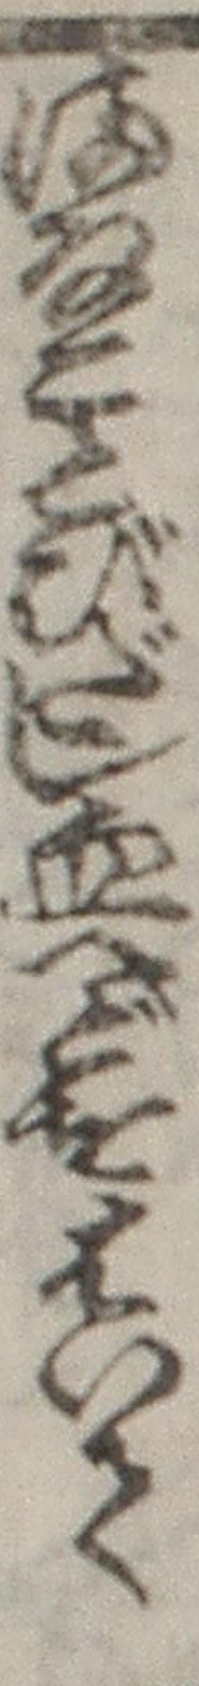まなことびだし血へどをはいて
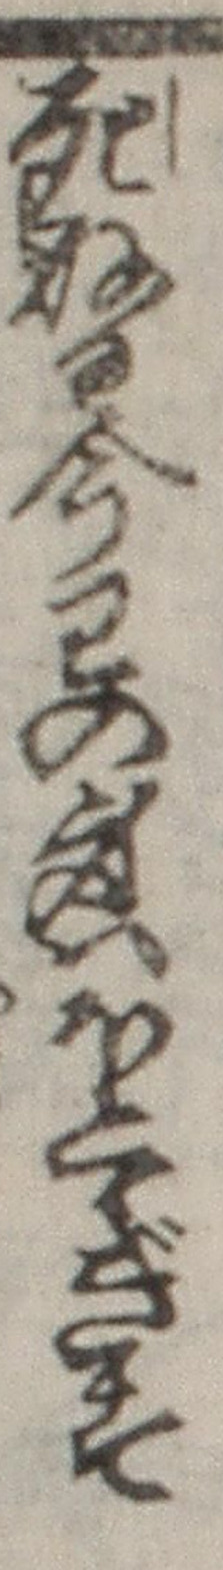死ぬる今わの身はほとゝぎす
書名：安政二卯年　江戸大地震并出火附
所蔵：東京大学地震研究所図書室 Earthquake Research Institute Library, The University of Tokyo, JAPAN
